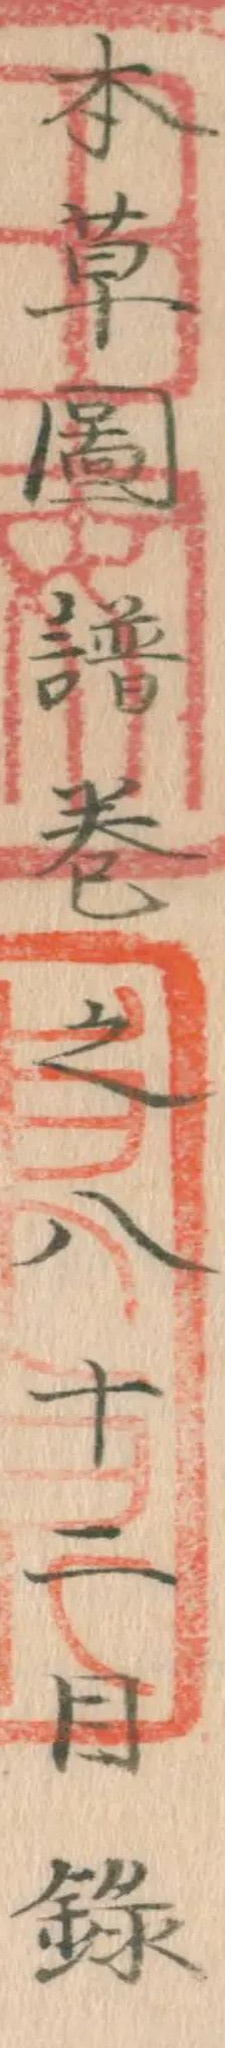本草図譜巻之八十二目録
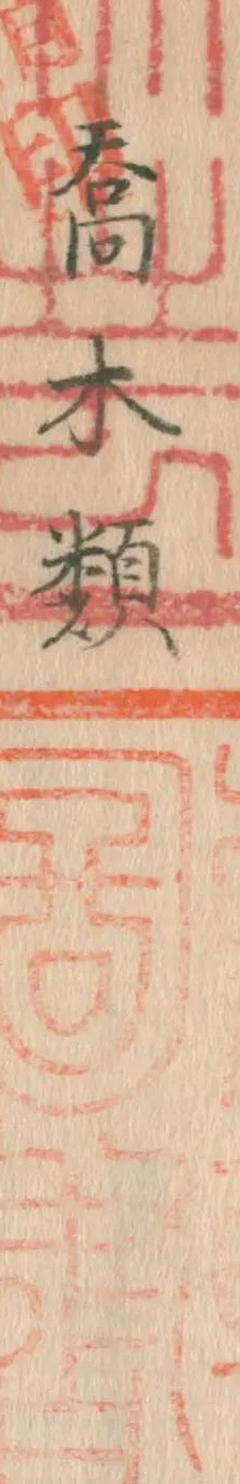喬木類
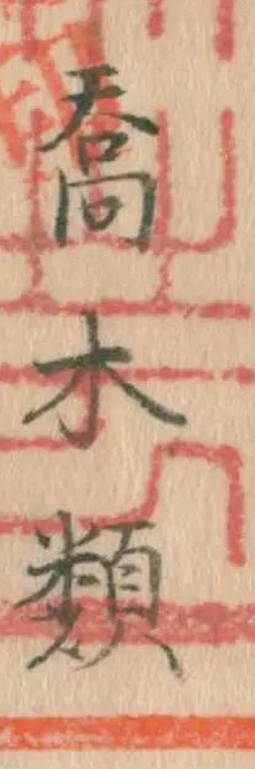喬木類

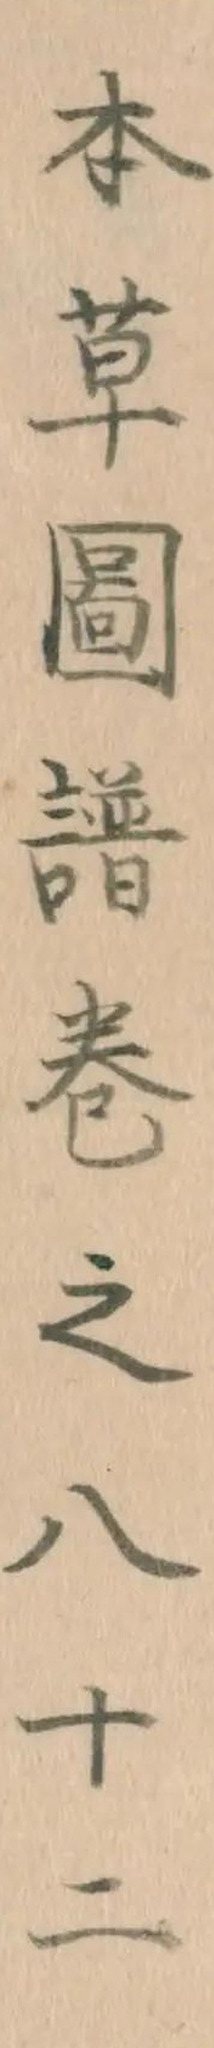本草図譜巻之八十二
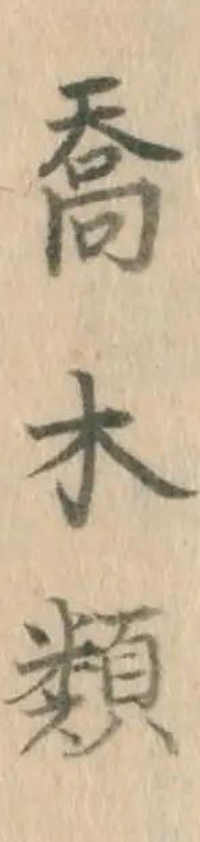高木類

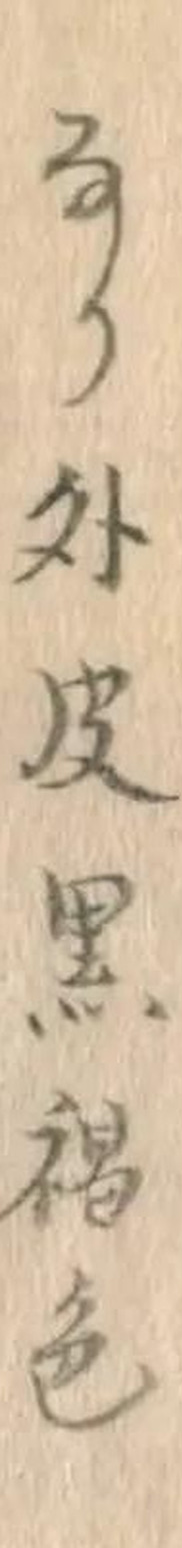なり外皮黒褐色
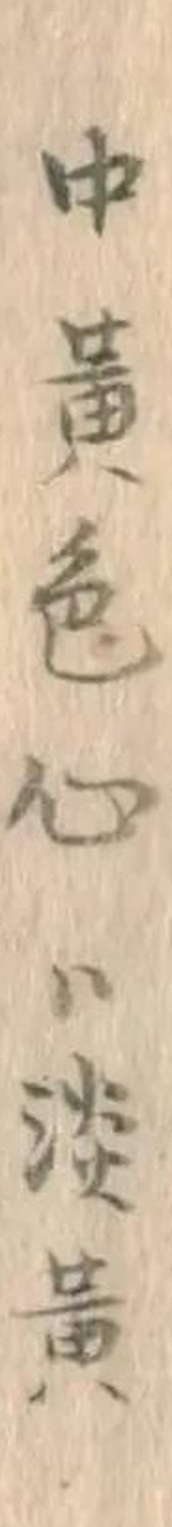中黄色心は淡黄
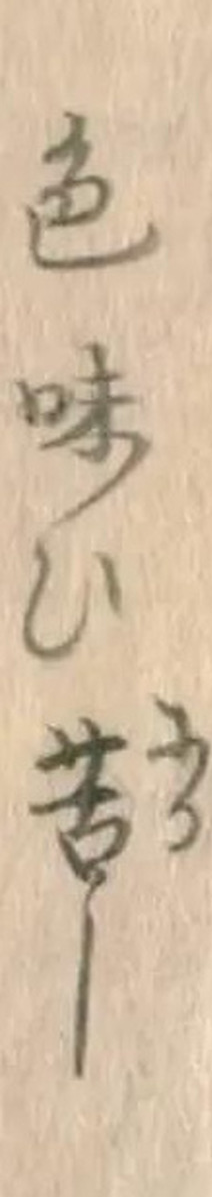色味は苦し

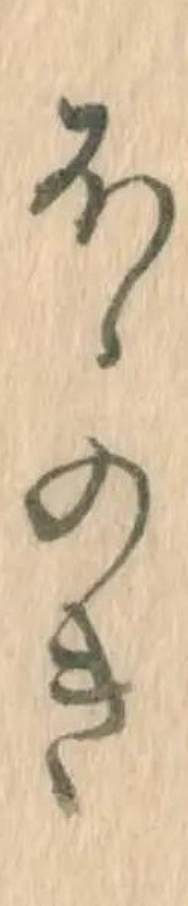ほゝのき

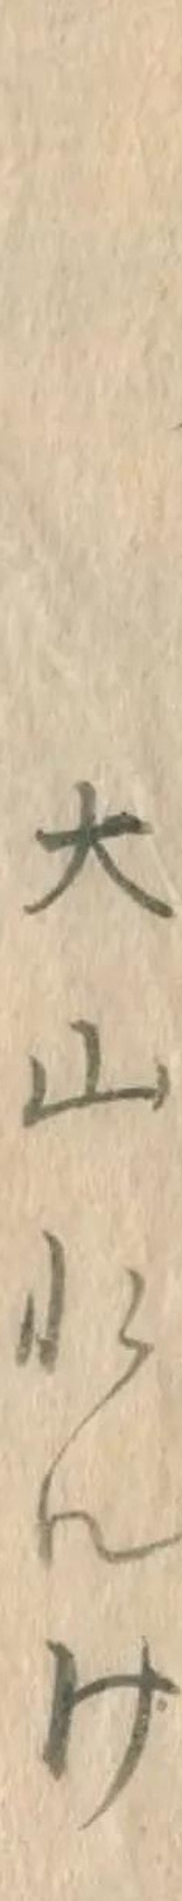大山れんけ
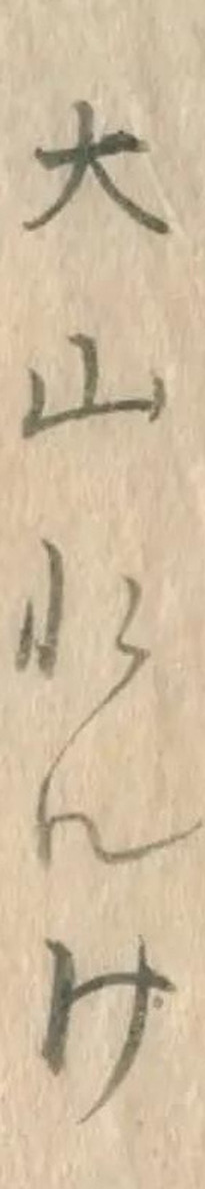大山れんけ
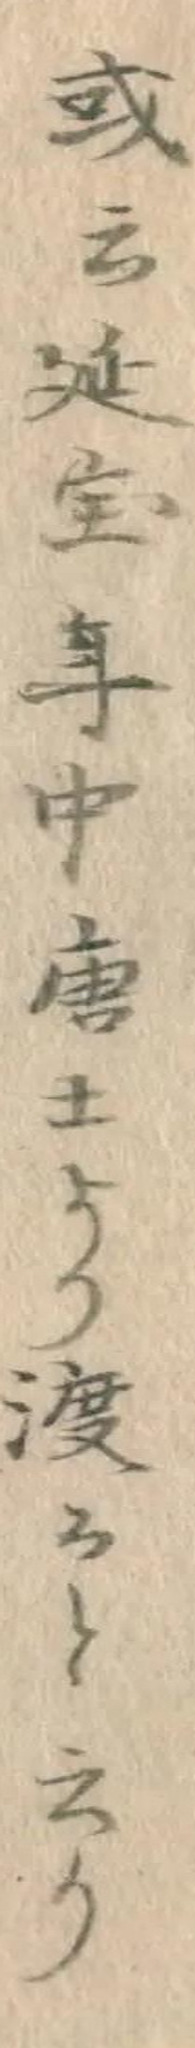或云延宝年中唐土より渡ると云り
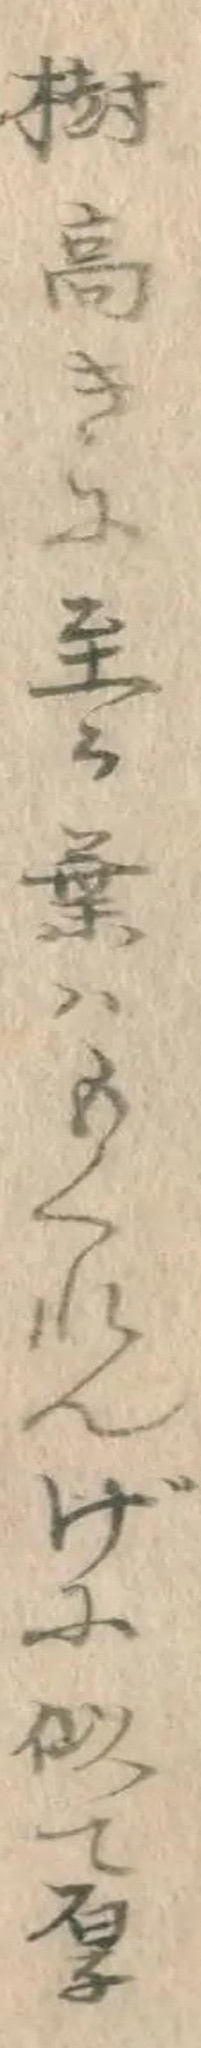樹高きに至る葉はもくれんげに似て厚
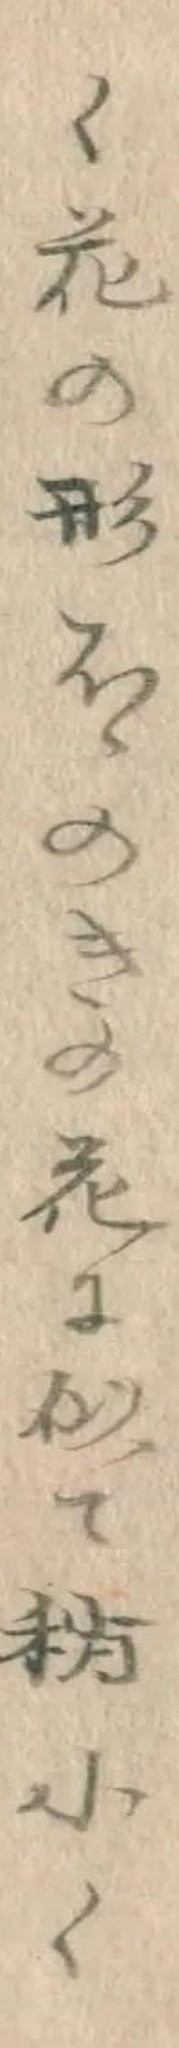く花の形ほゝのきの花に似て梢小く
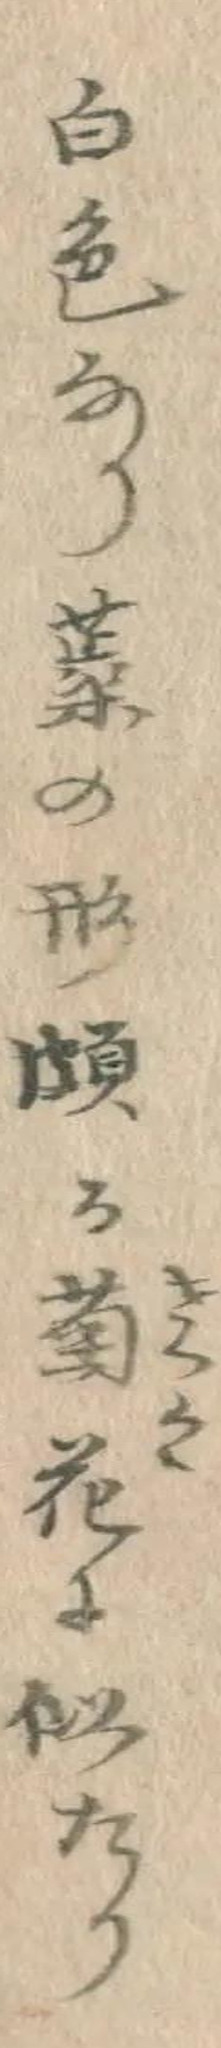白色なり葉の形頗る菊花に似たり
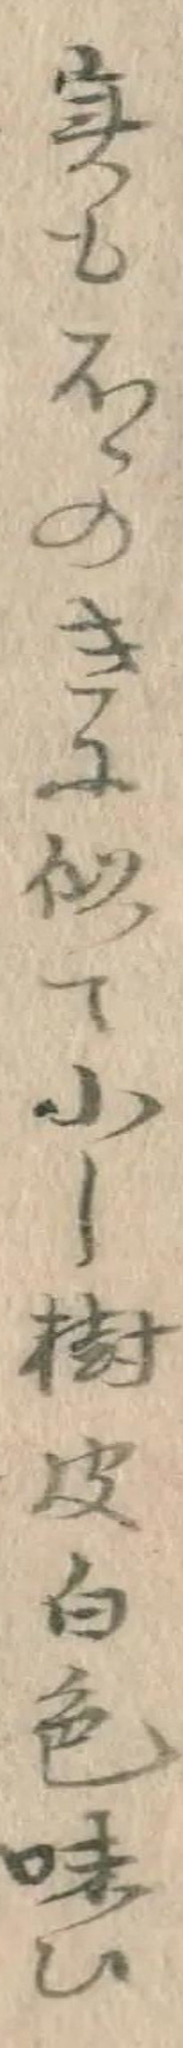実もほゝのきに似て小し樹皮白色味ひ
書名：本草図譜. 巻82-84
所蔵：国立国会図書館 National Diet Library, JAPAN
